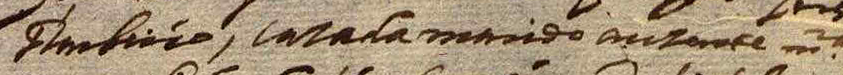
Barbeiro, cazada marido auzente m.ra
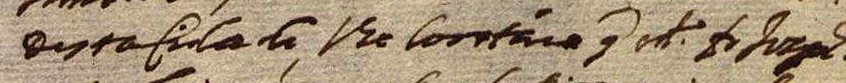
desta Cidade, lhe contara q̄ o d̄.o fr Iozeph.
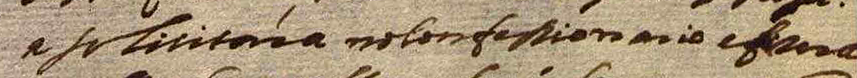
a solicitara no confessionario e fizera
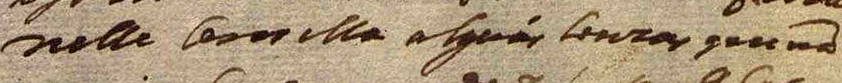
nelle com ella alguās couzas que nā
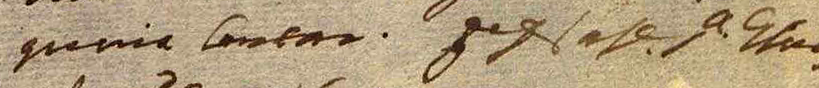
queria contar. gde Ds̄ a V sa. Eluas
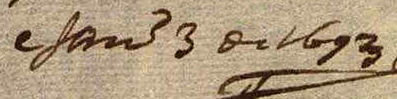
e Jan̄ 3 de 1693
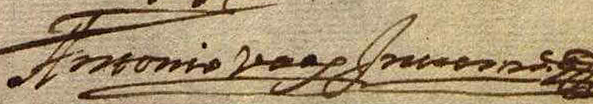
Antonio vaas Jnuerno
